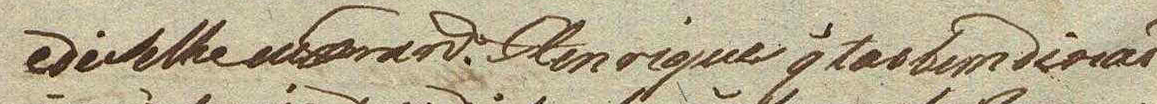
e diselhe eu Fran.co Henriques q̄ taobem disiaõ
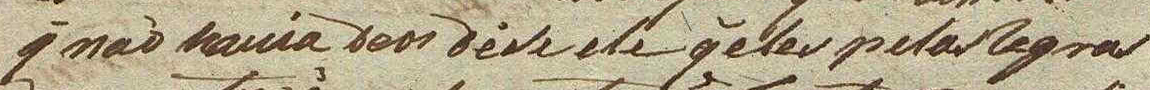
q̄ naõ hauia deos dise ele q̄ eles pelas Regras
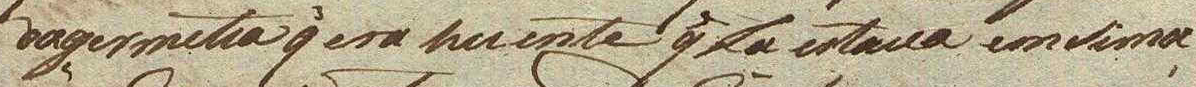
da germetia q̄ era hu ente q̄ La estaua em sima
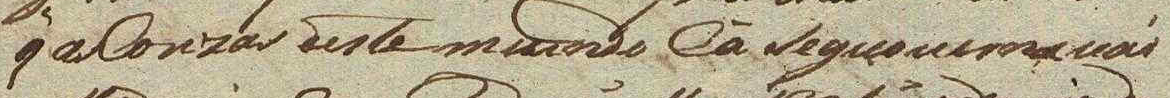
q̄ a Couzas deste mundo Cá se guouernauaõ
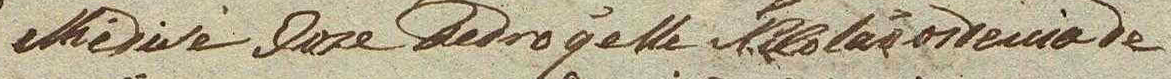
e lhe dise Ioze Pedro q̄ elle Nicolaó os deuia de
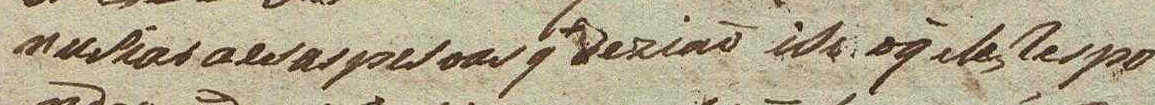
nusiar a esas pesoas q̄ deziaõ iso: o q̄ ele Respo
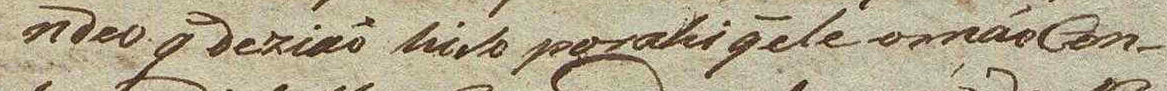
ndeo q̄ deziaõ hiso por ahi q̄ ele os naõ Con
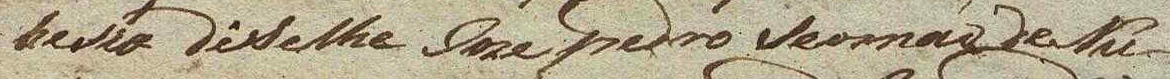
hesia dêselhe Ioze pedro se o máo deNū
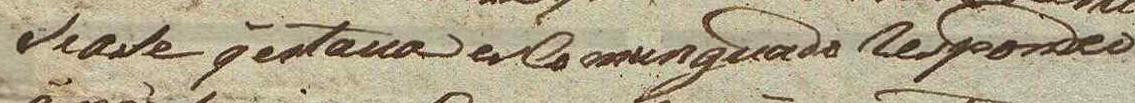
sease q̄ estaua esComunguado Respondeo
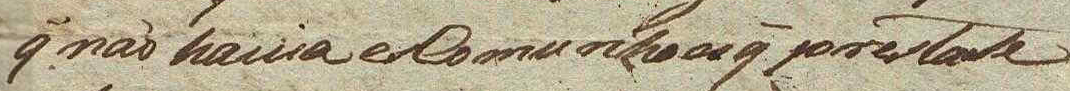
q̄ naõ hauia esComunhoes q̄ prestase
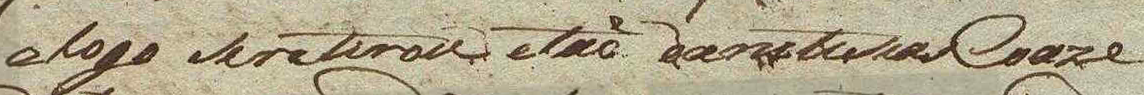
e logo se retirou e taõ da notesias Coaze
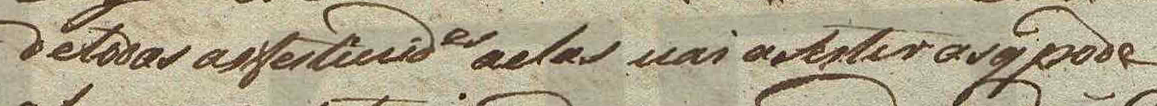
de todas as festiuid.es a elas uai asester as q̄ pode
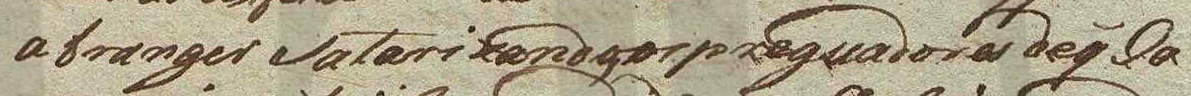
abranger satarizando os preguadores de q̄ Ia
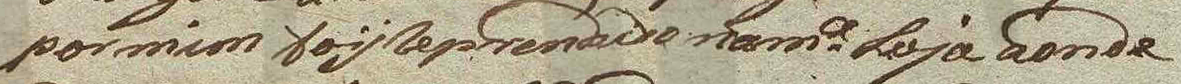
por mim foy Reprendido na m.e Loja aonde
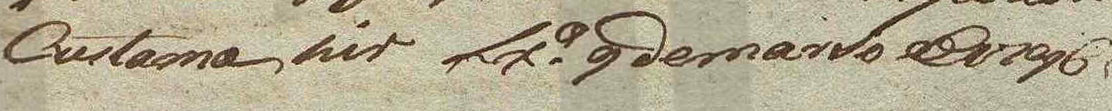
Custama hir Lx.a 9 de marso d̄ 1796
